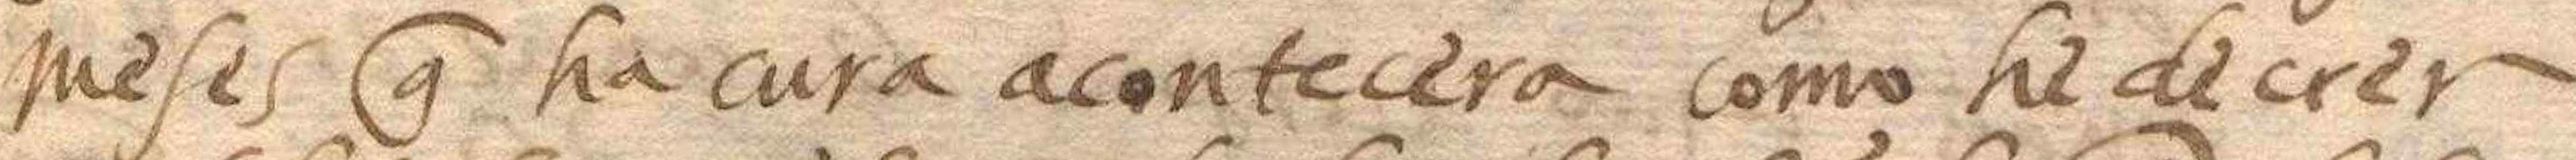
meses q̄ ha cura acontecera como he de crer
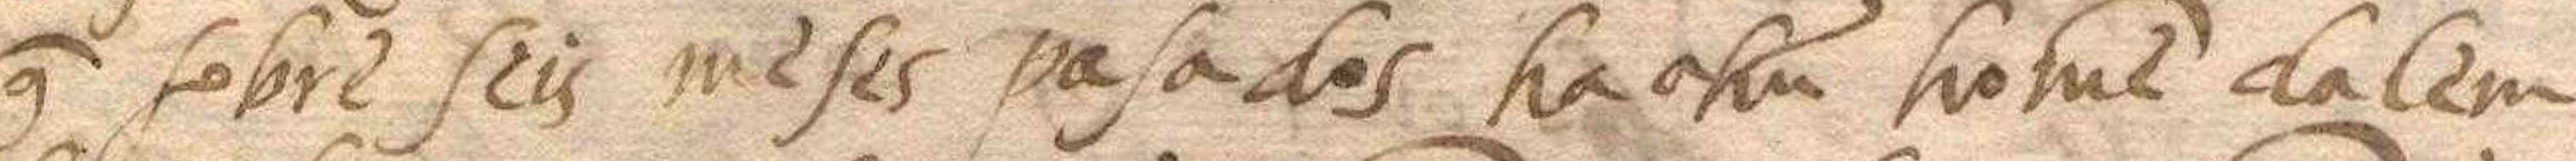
q̄ sobre seis meses pasados ha a hū homē dalem
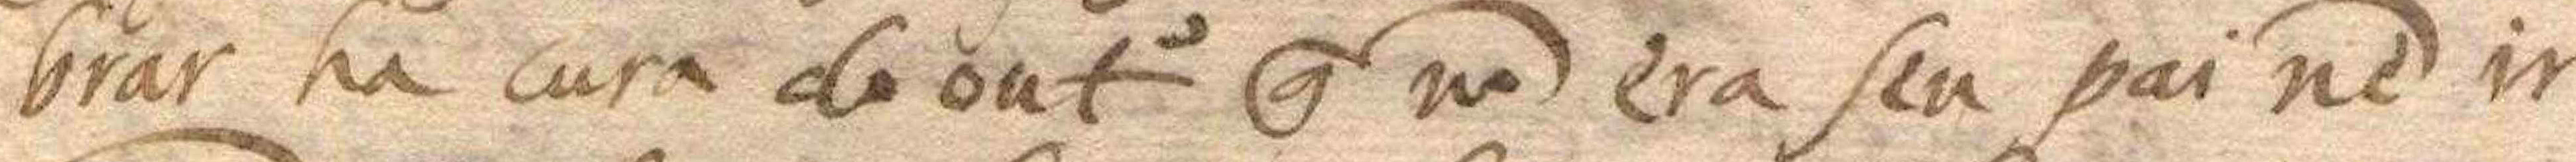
brar ha cura do outo q̄ n̄o era seu pai nē ir
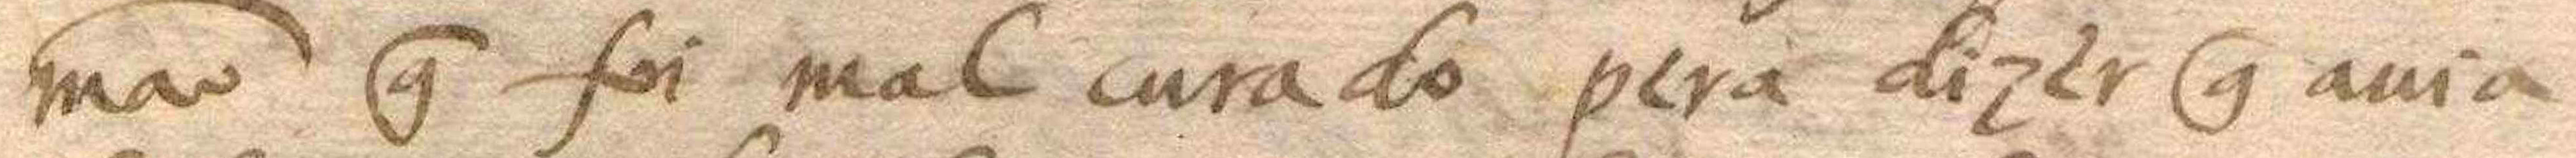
mão q̄ foi mal curado pera dizer q̄ auia
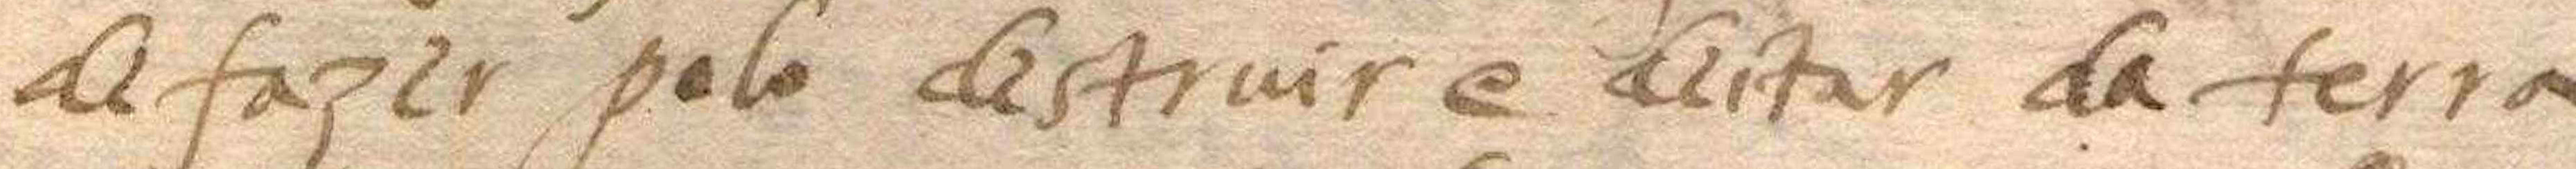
de fazer polo destruir e deitar da terra
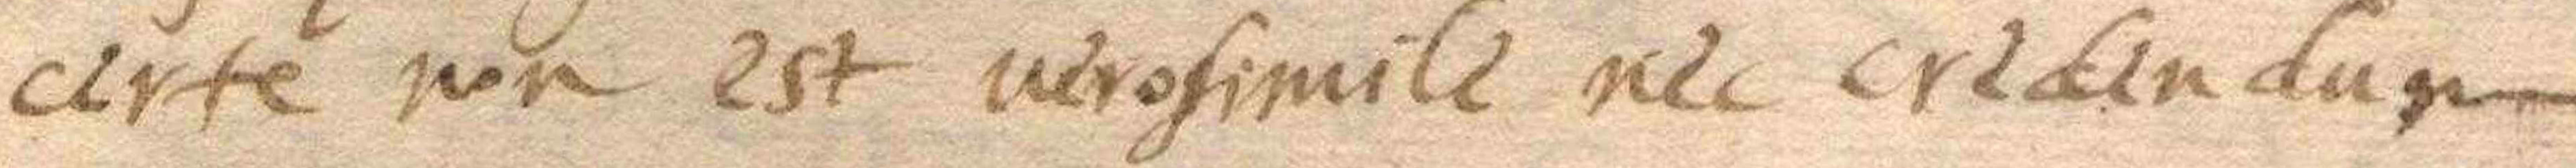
certe non est uerosimile nec credendum
